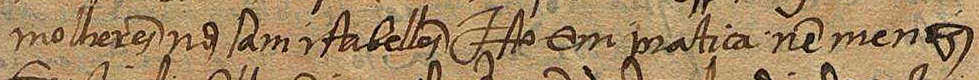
molheres nō sam estabelles Jsto em pratica nē menos
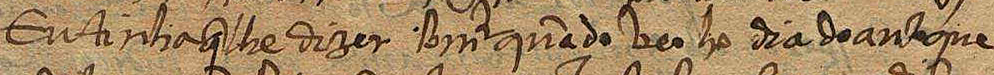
Eu tinha q̄ lhe dizer somte quādo veo ho dia do auto que
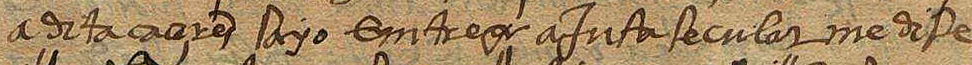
a dita caceres sayo Emtrege a Justa secular me dise
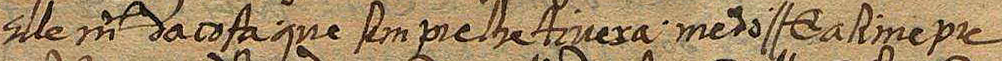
Elle mel da costa que sempre lhe tiuera medo // E asi me pre
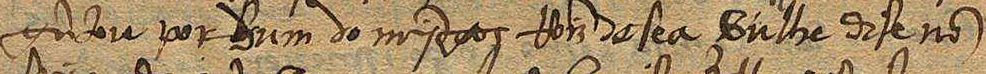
gūtou por hum domȳgos Roiz̄ de sea Eu lhe dise nō
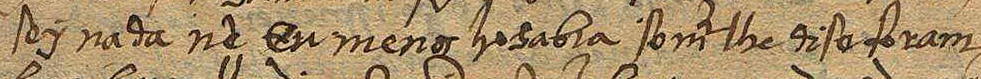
sey nada nē Eu menos ho sabia somte lhe dise foram
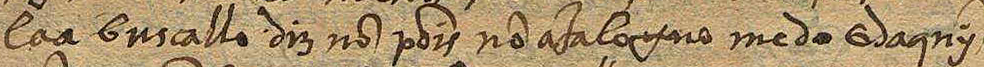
laa buscallo diz nō pois nō aJa loguo medo E daquy
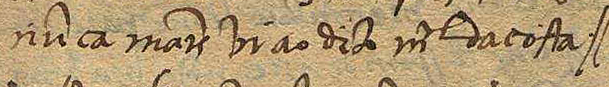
nūca mais vi ao dito mel da costa. //
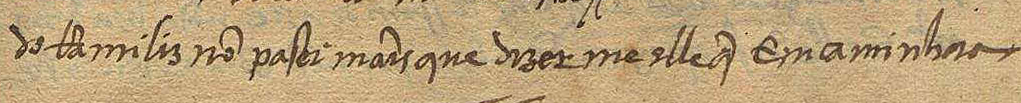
do Ramiliz nō pasei mais que dizer me Elle q̄ Emcaminhara
